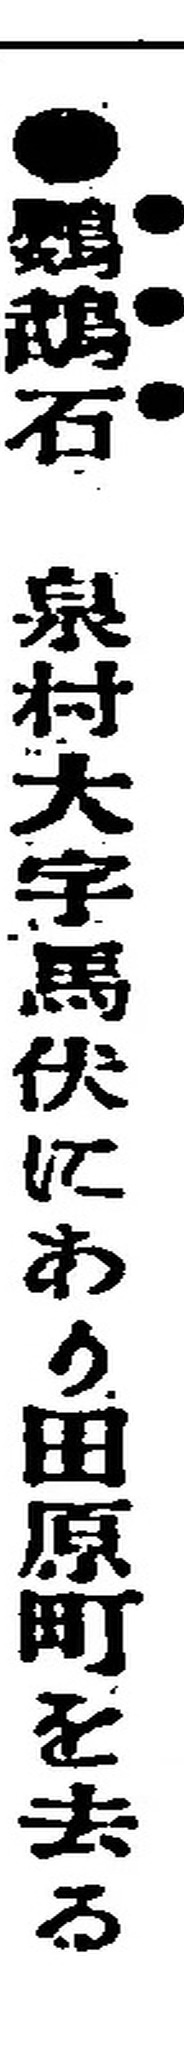●鸚鵡石泉村大字馬伏にあり田原町を去る
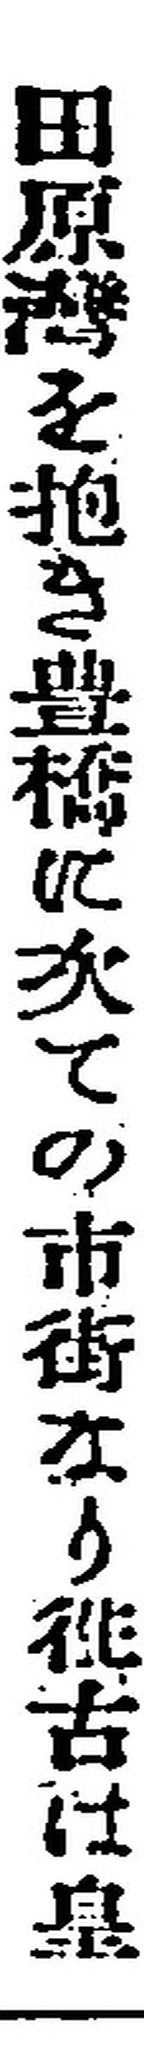田原湾を抱き豊橋に次ての市街なり往古は皇
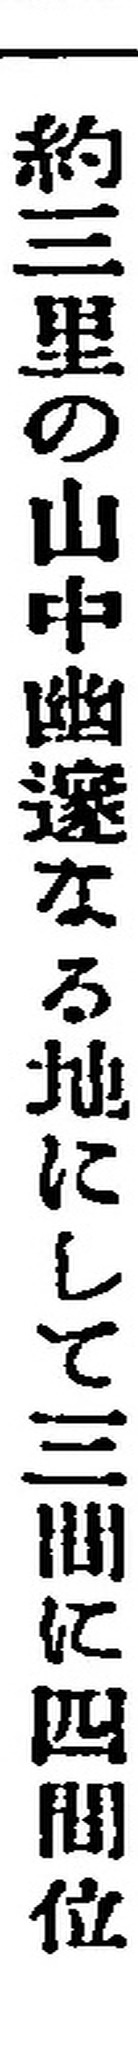約三里の山中幽邃なる地にして三間に四間位
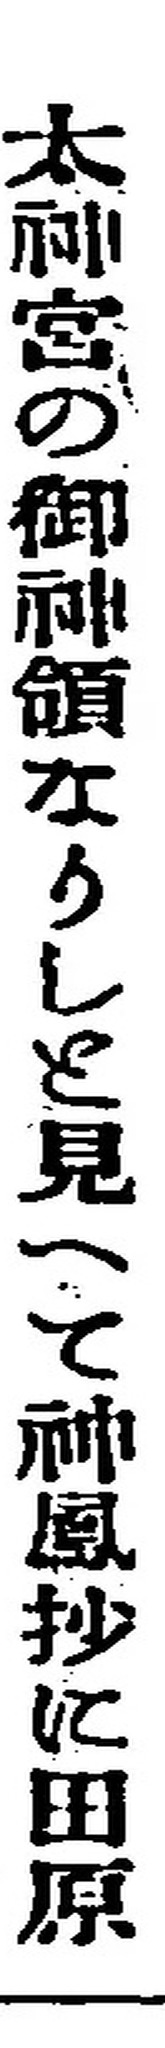太神宮の御神領なりしと見へて神鳳抄に田原
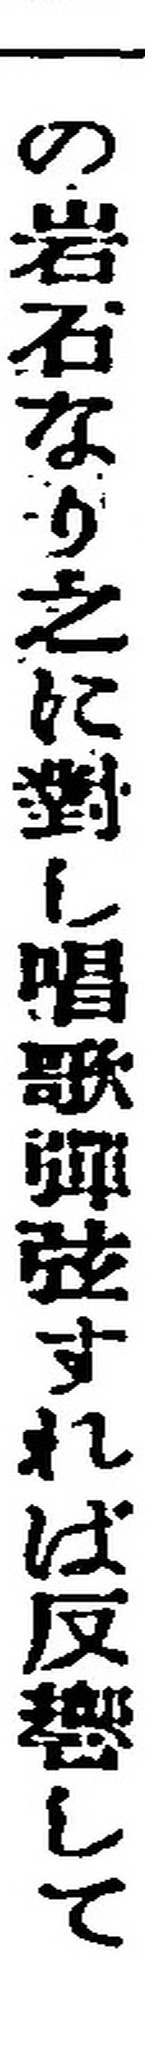の岩石なり之に対し唱歌弾弦すれば反響して
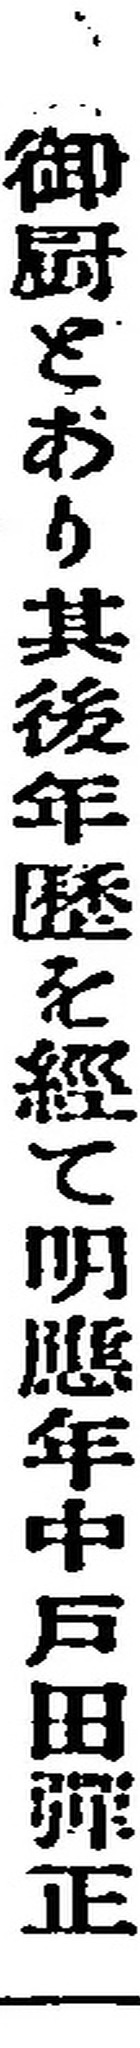御厨とあり其後年歴を経て明応年中戸田弾正
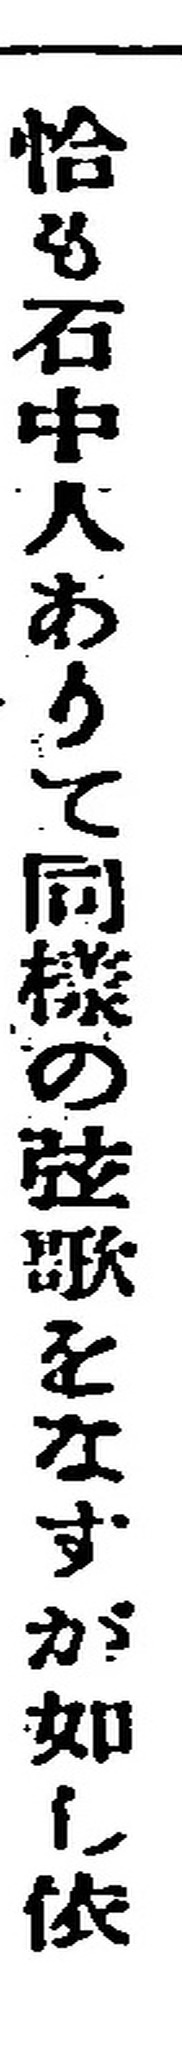恰も石中人ありて同様の弦歌をなすが如し依
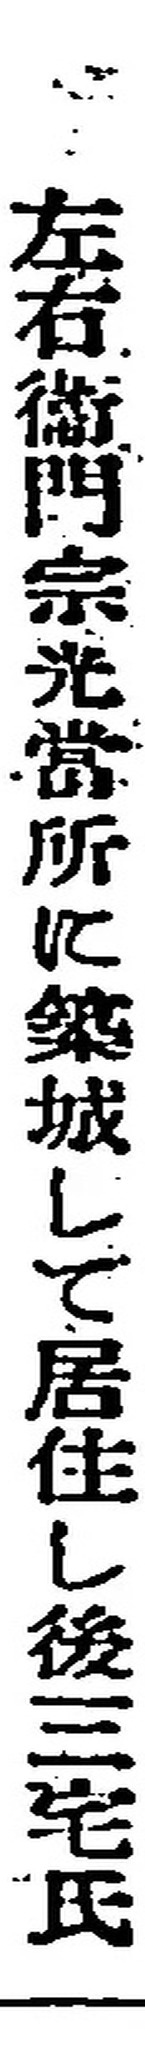左右衛門宗光当所に築城して居住し後三宅氏
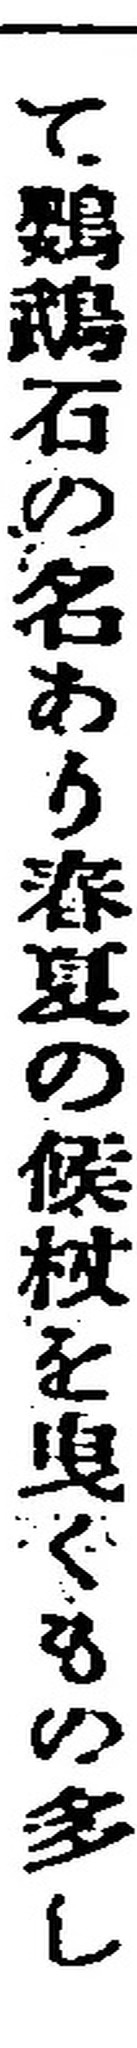て鸚鵡石の名あり春夏の候杖を曳くもの多し
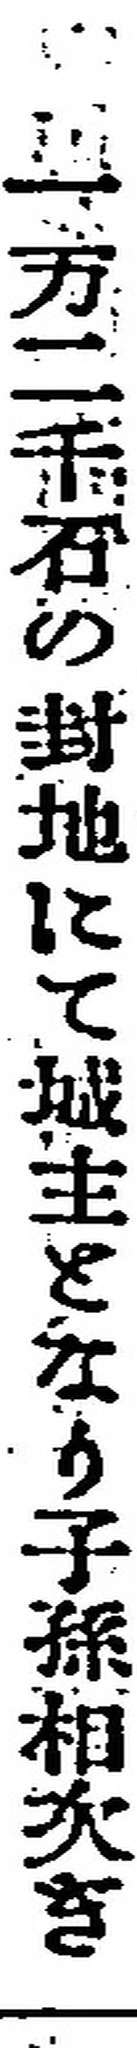一万二千石の封地にて城主となり子孫相次ぎ
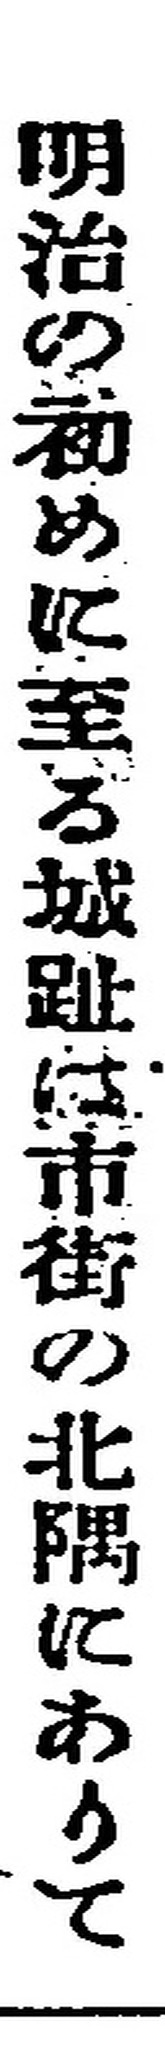明治の初めに至る城趾は市街の北隅にありて
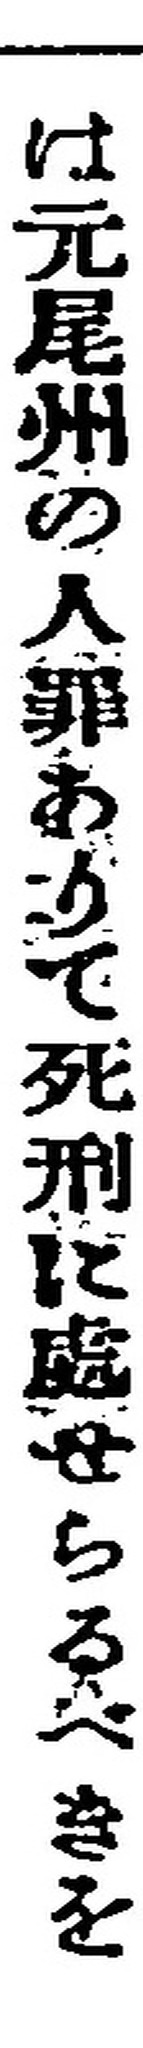は元尾州の人罪ありて死刑に処せらるべきを

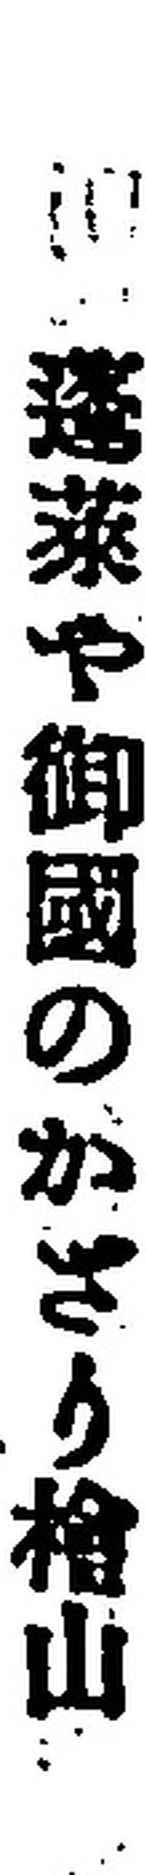蓬莱や御国のかざり檜山
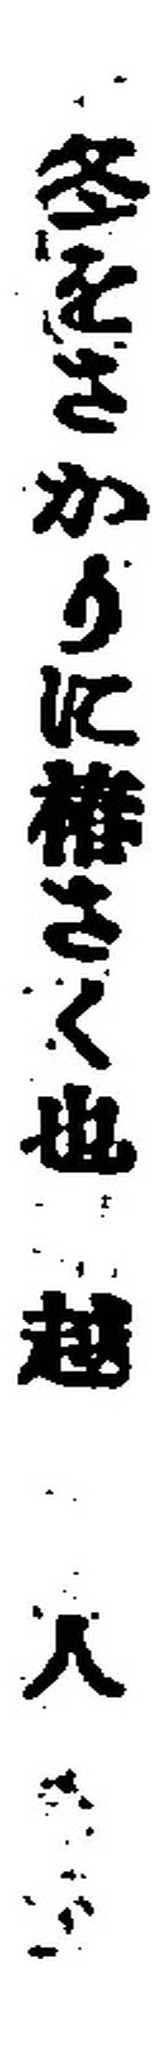冬をさかりに椿さく也越人
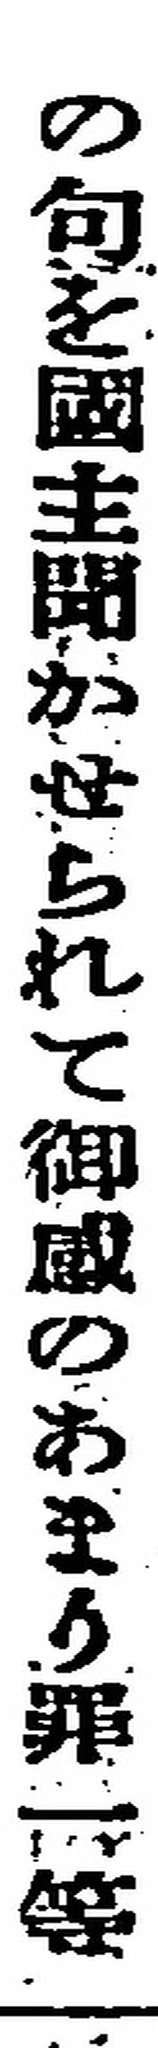の句を国主聞かせられて御感のあまり罪一等
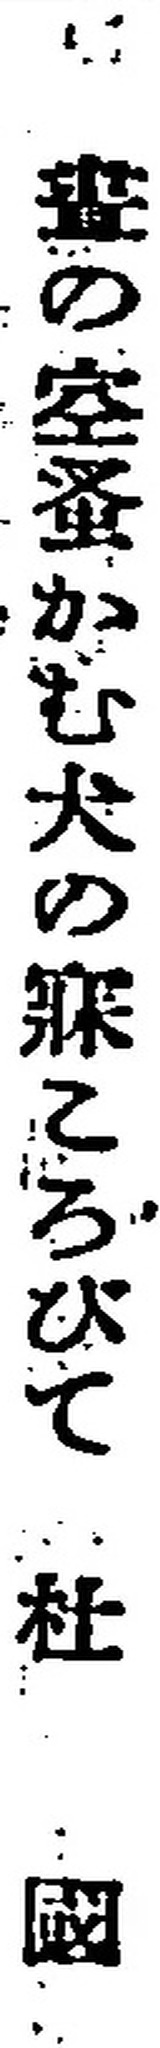昼の空蚤かむ犬の寐ころびて杜国
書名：東参名勝案内
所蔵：国立国会図書館 National Diet Library, JAPAN
